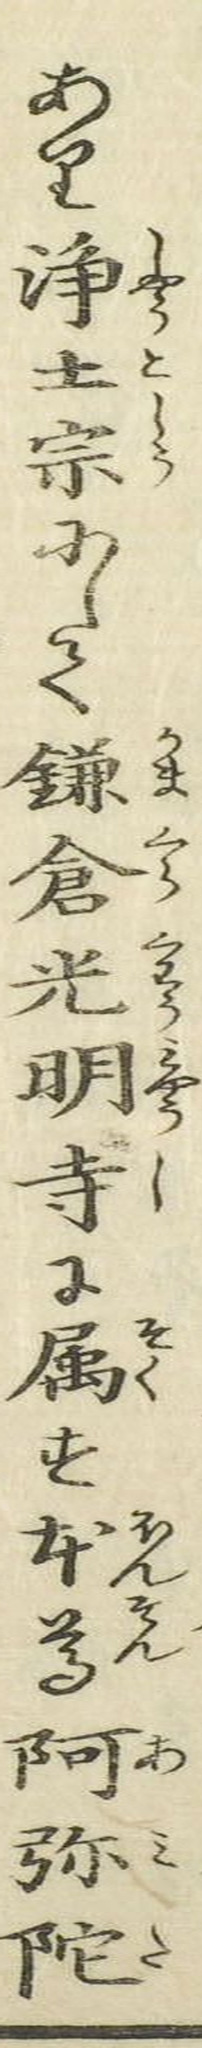あり浄土宗にして鎌倉光明寺に属す本尊阿弥陀
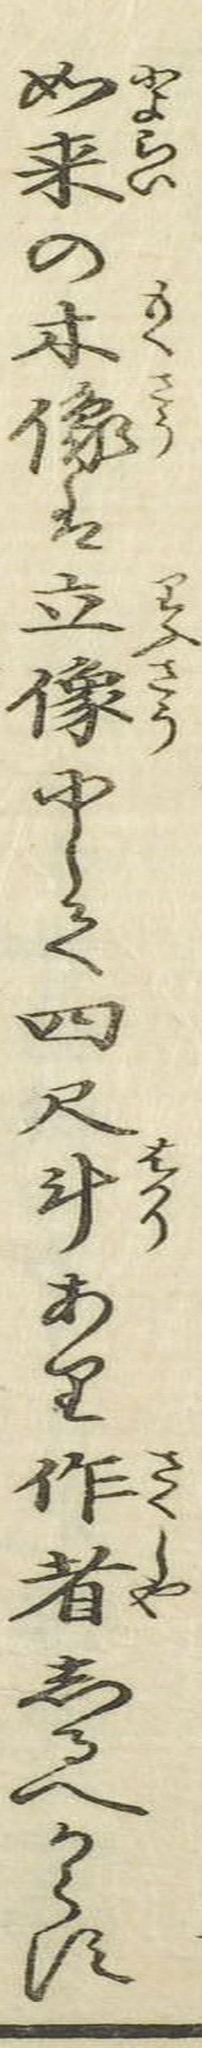如来の木像は立像にして四尺斗あり作者しるへからす
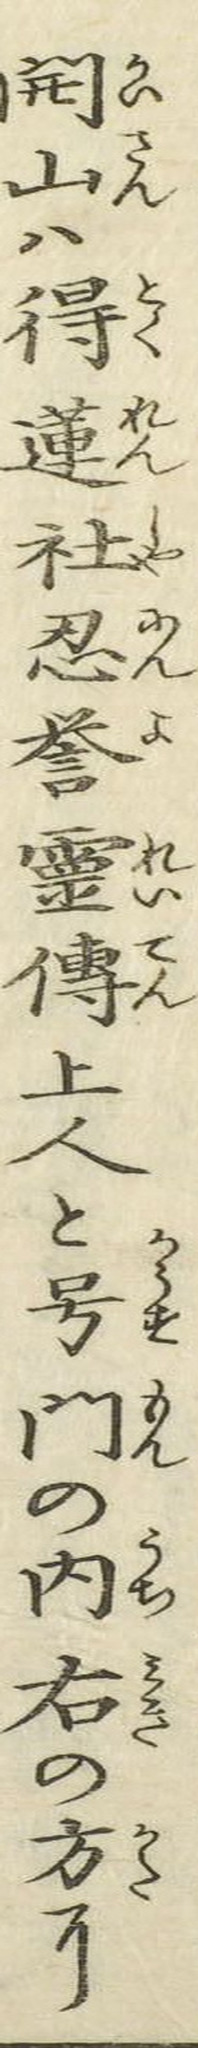開山は得蓮社忍誉霊伝上人と号門の内右の方に
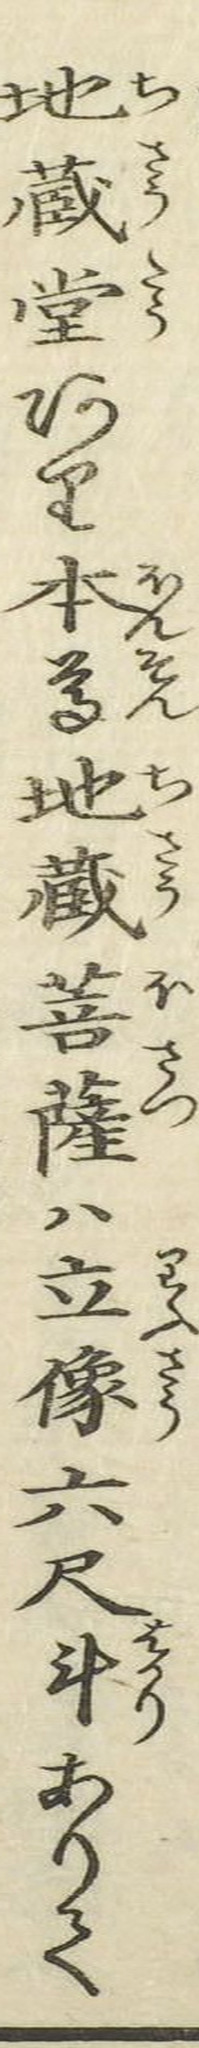地蔵堂あり本尊地蔵菩薩は立像六尺斗ありて
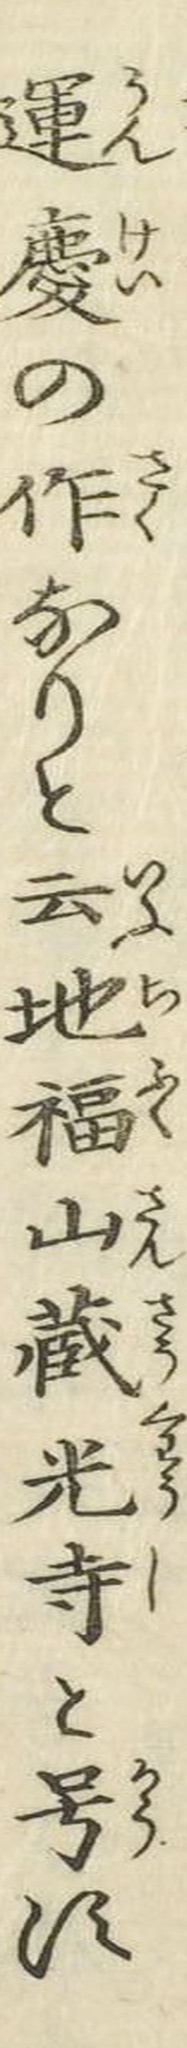運慶の作なりと云地福山蔵光寺と号す
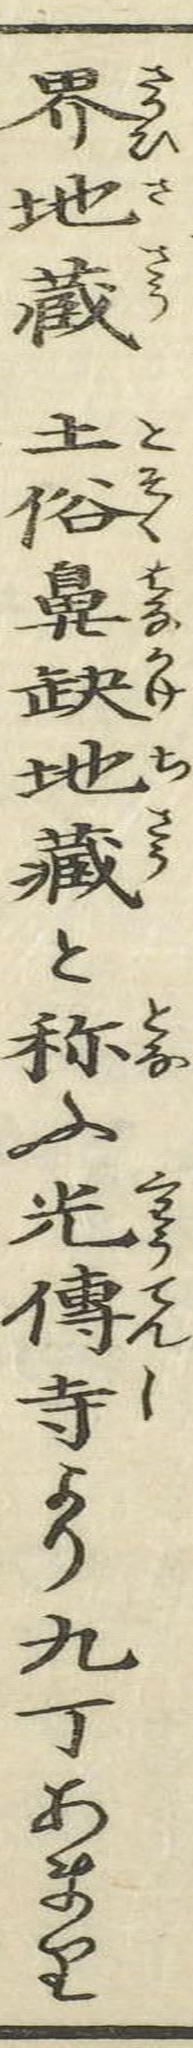界地蔵土俗鼻欠地蔵と称ふ光伝寺より九丁あまり
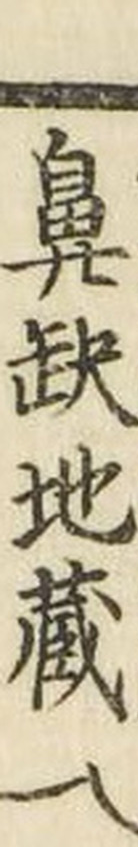鼻欠地蔵

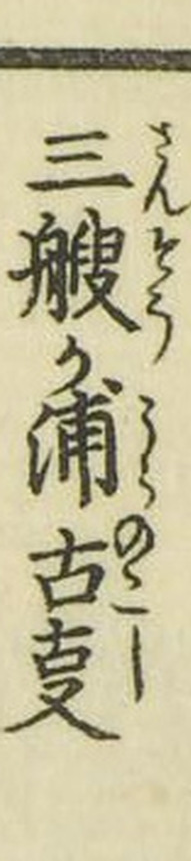三艘か浦故事
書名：江戸名所図会 20巻 巻之6
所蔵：東京学芸大学教育コンテンツアーカイブ
